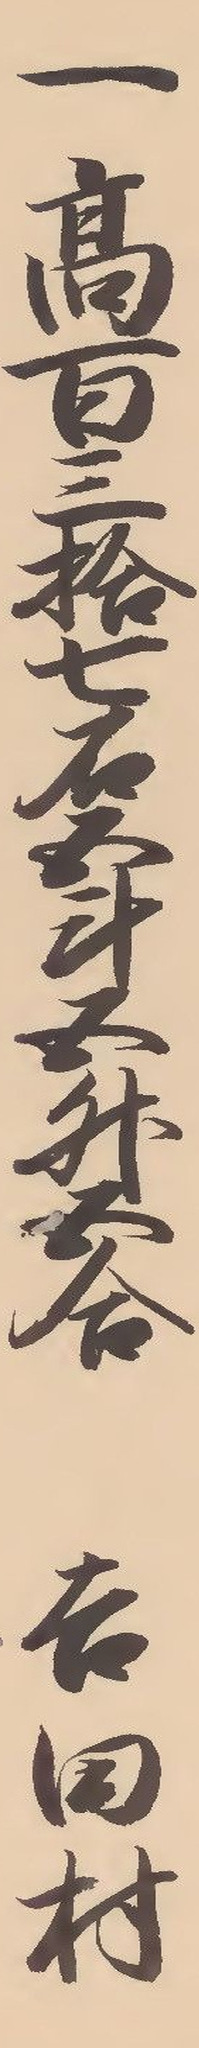一高百三拾七石五斗五升五合吉田村

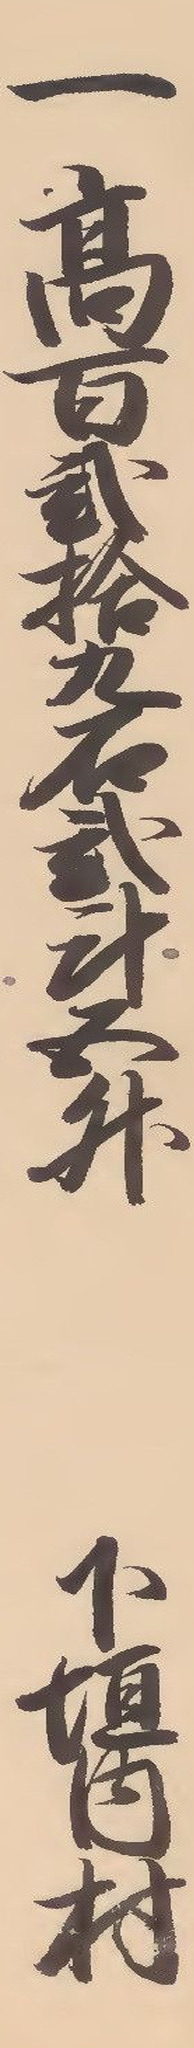一高百弐拾九石弐斗五升下垣内村
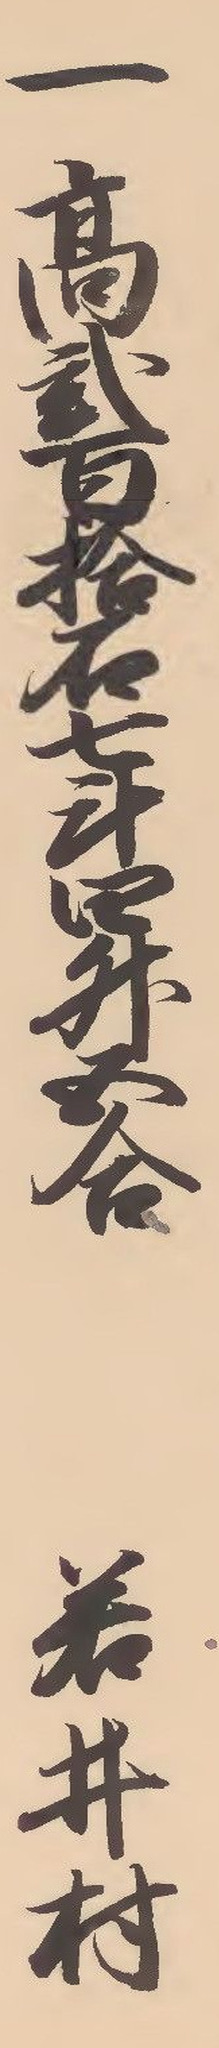一高弐百拾石七斗四升五合若井村
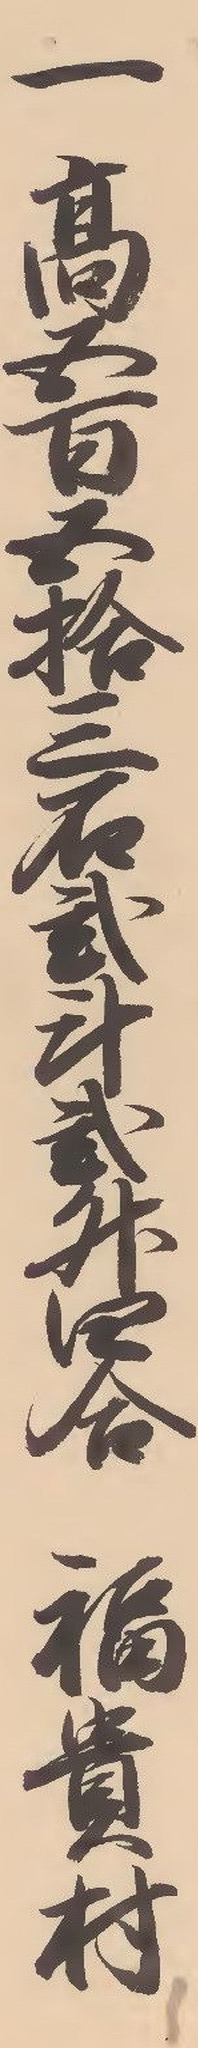一高五百五拾三石弐斗弐升四合福貴村
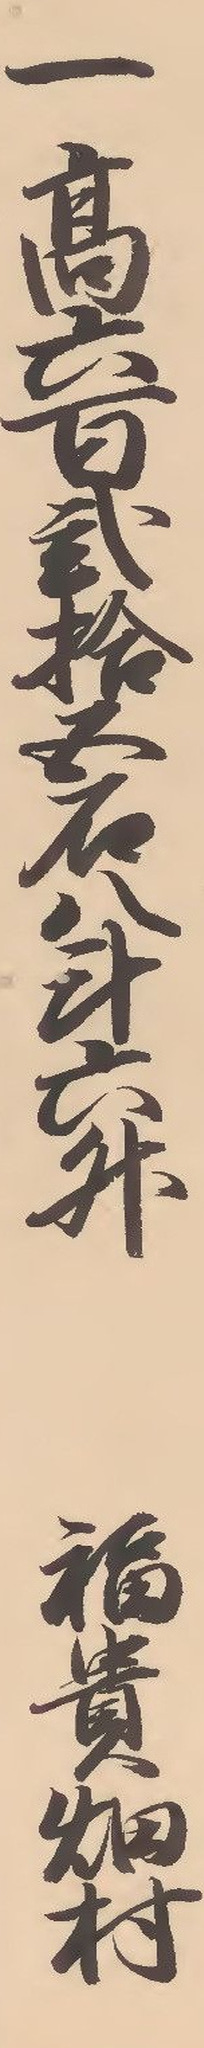一高六百弐拾五石八斗六升福貴畑村
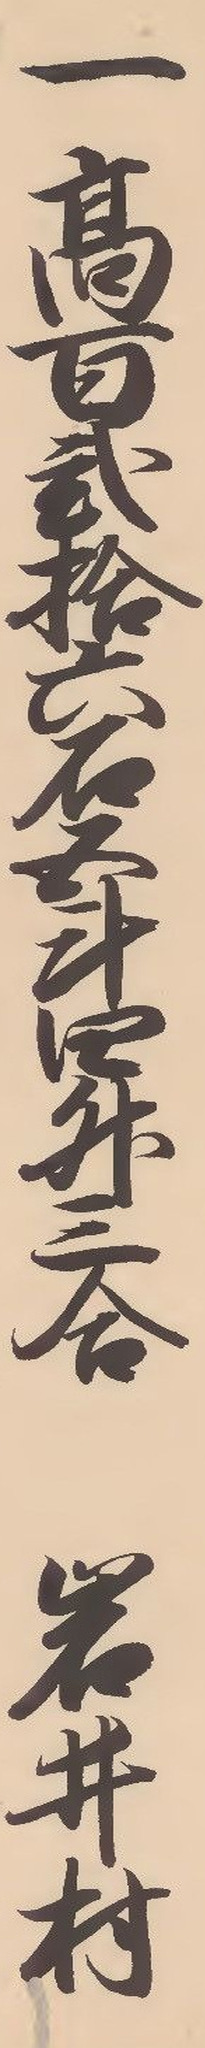一高百弐拾六石五斗四升三合岩井村
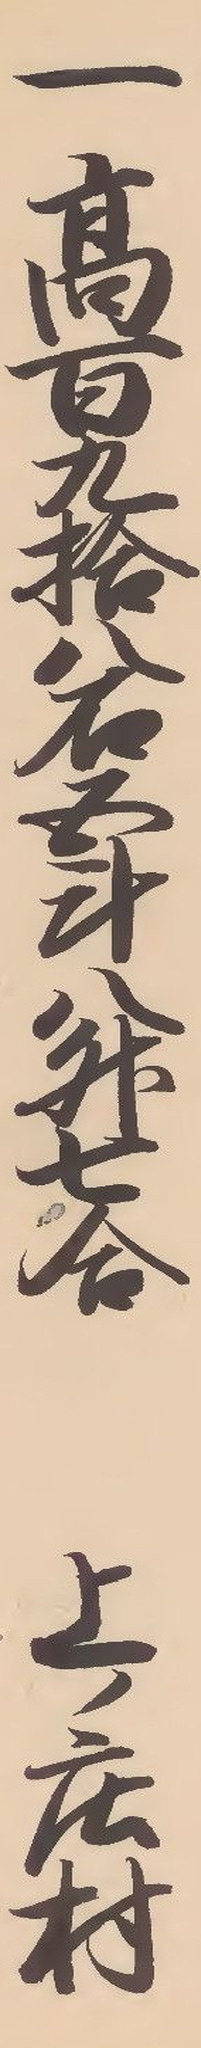一高百九拾八石五斗八升七合上ノ庄村
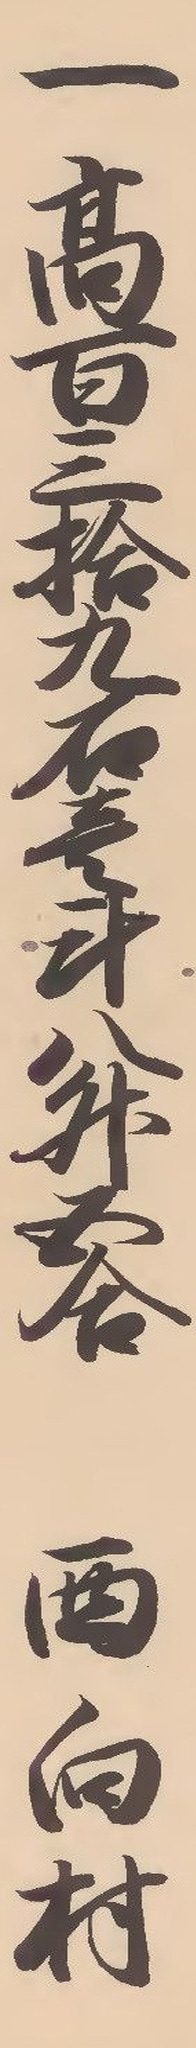一高百三拾九石壱斗八升五合西向村

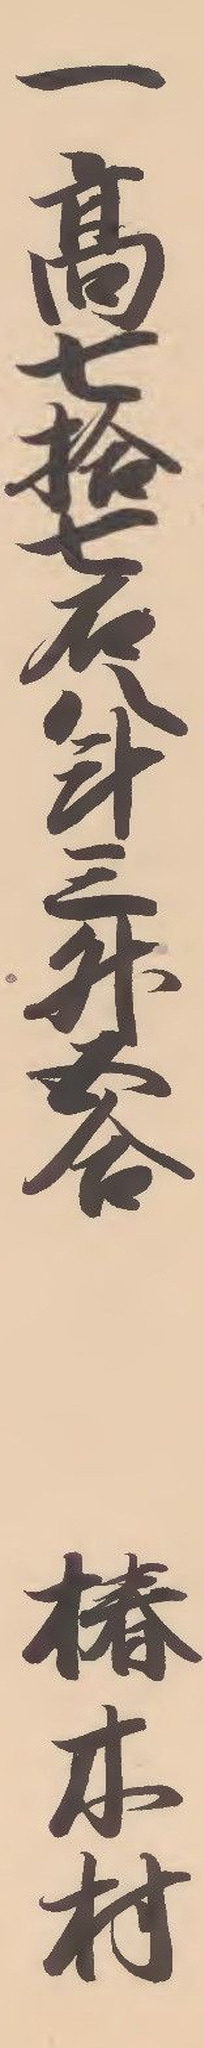一高七拾七石八斗三升五合椿木村
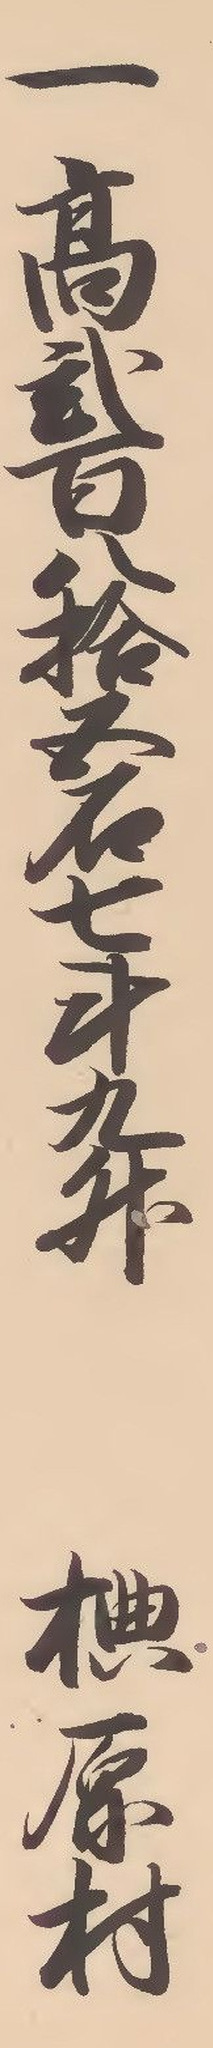一高弐百八拾五石七斗九升椣原村
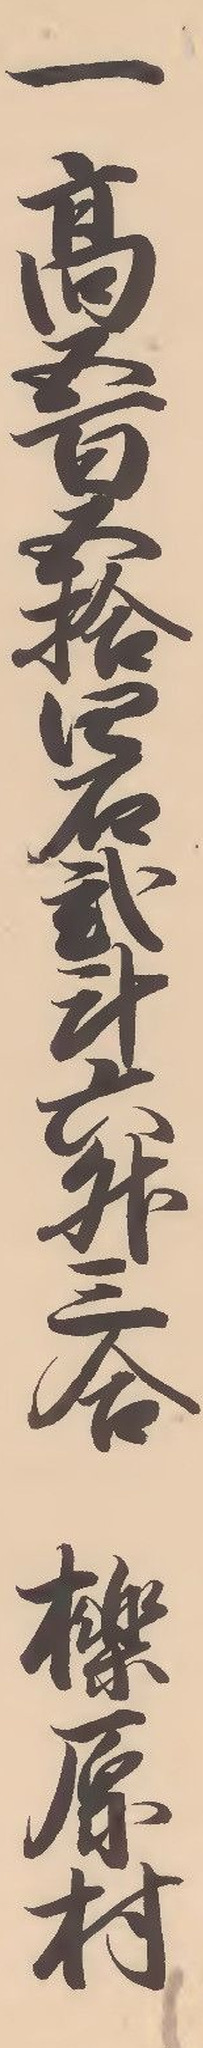一高五百五拾四石弐斗六升三合櫟原村
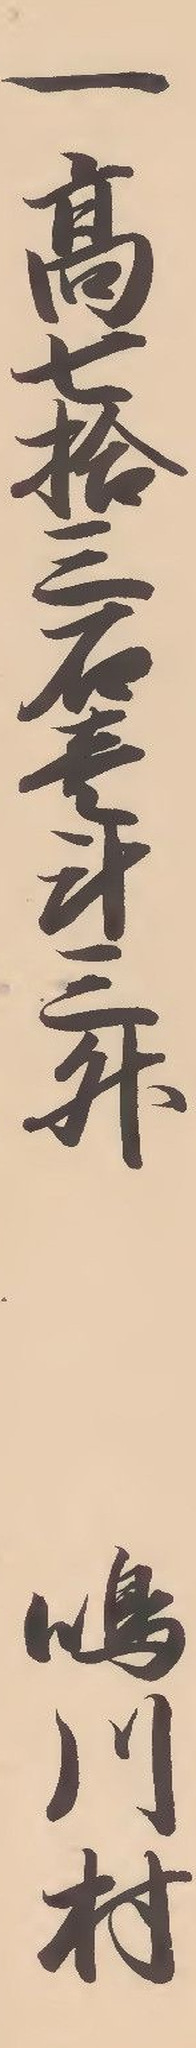一高七拾三石壱斗三升鳴川村
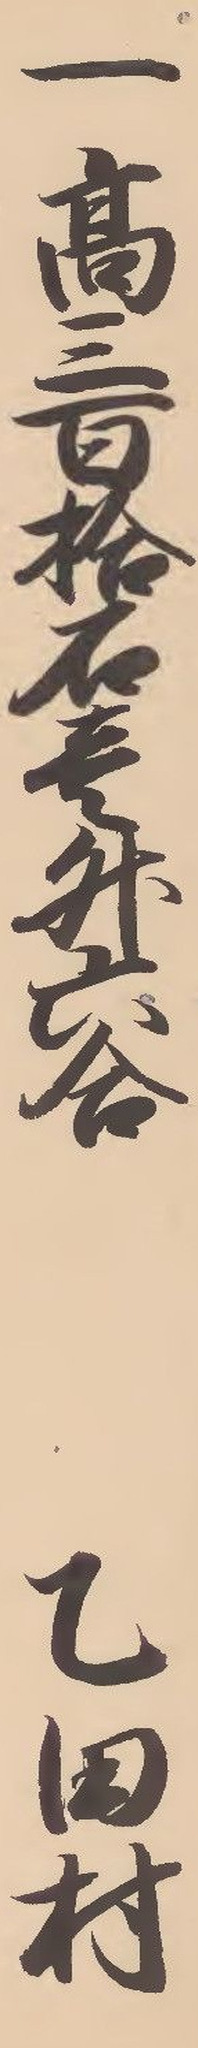一高三百拾石壱升六合乙田村
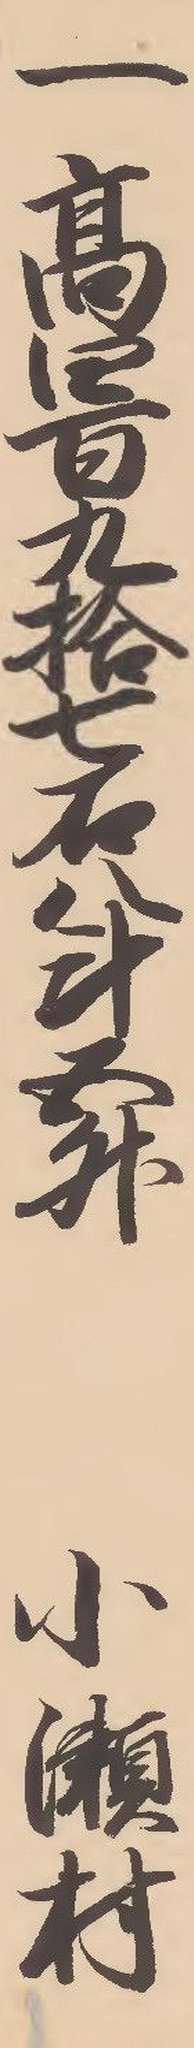一高四百九拾七石八斗五升小瀬村
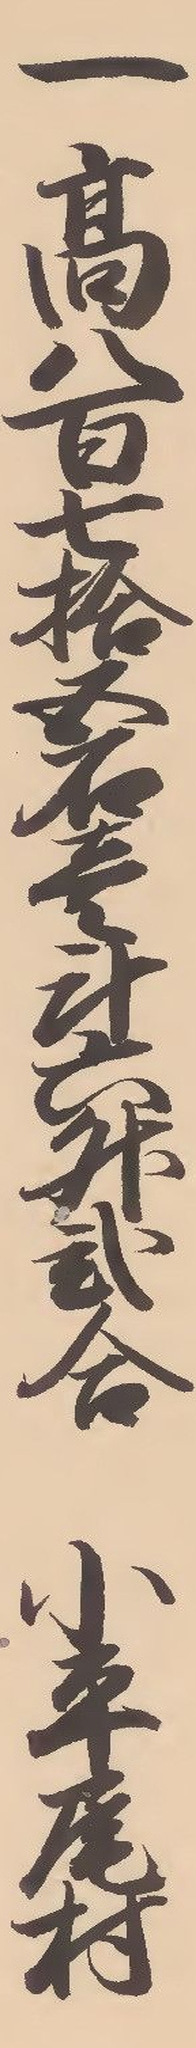一高八百七拾五石壱斗六升弐合小平尾村
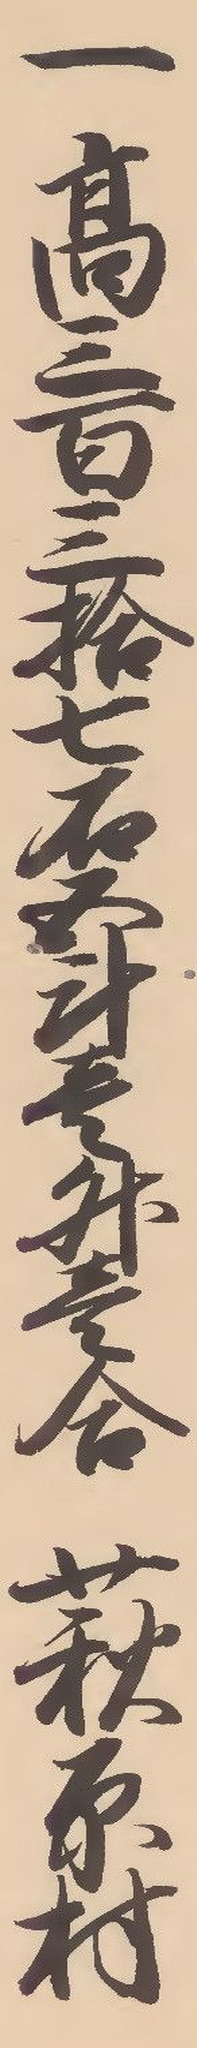一高三百三拾七石五斗壱升壱合萩原村
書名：大和国郷帳
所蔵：国立公文書館 National Archives of Japan
